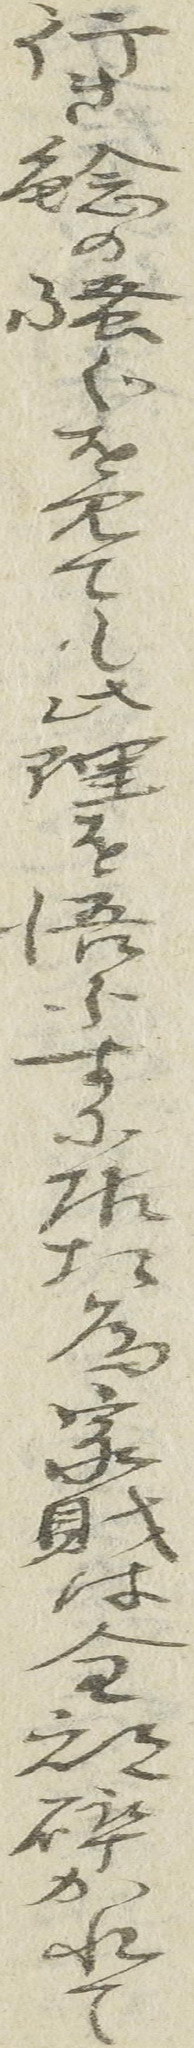行き鯰の騒ぐを見ても此理を悟らすに居た為家財は全部砕かれて

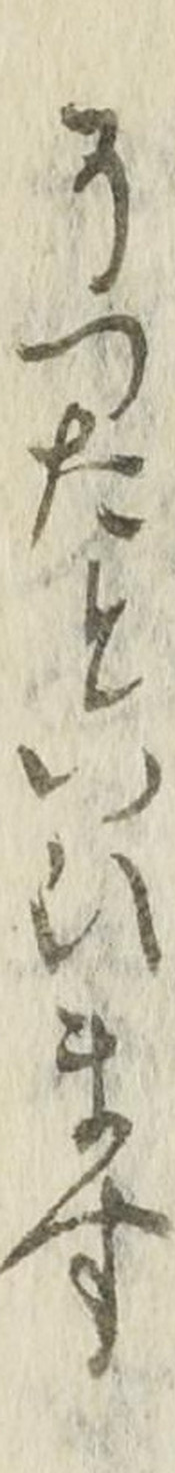了つたといひます
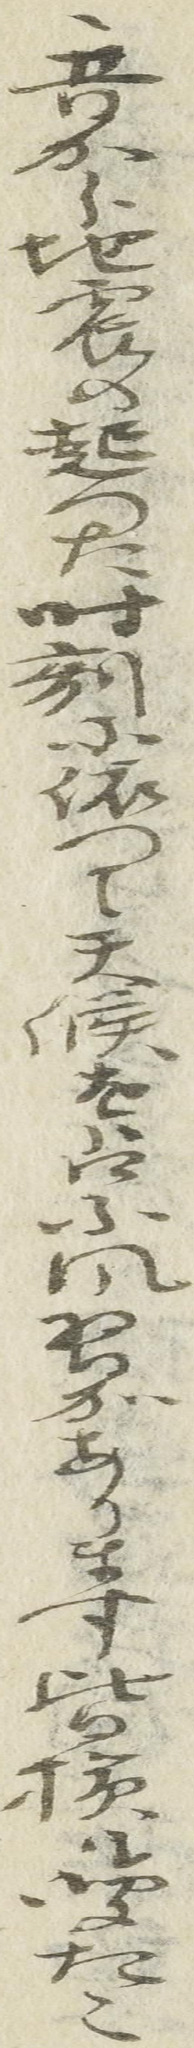一昔から地震の起つた時刻に依つて天候を占ふ風習があります皆様も聞たこ
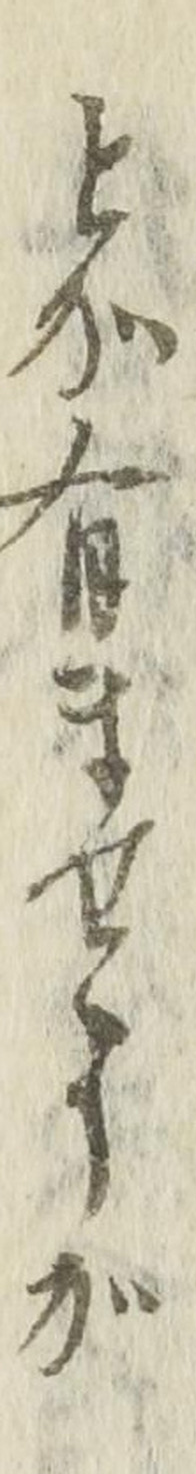とが有ませうが
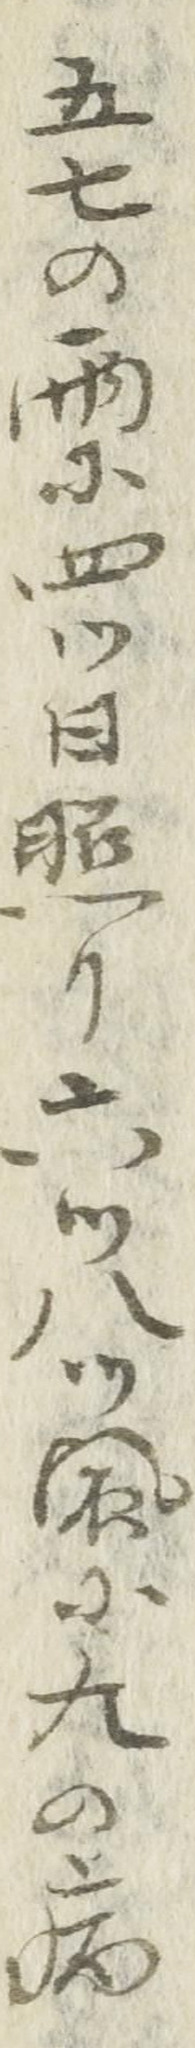五七の雨に四つ日照り六つ八つ風に九の病
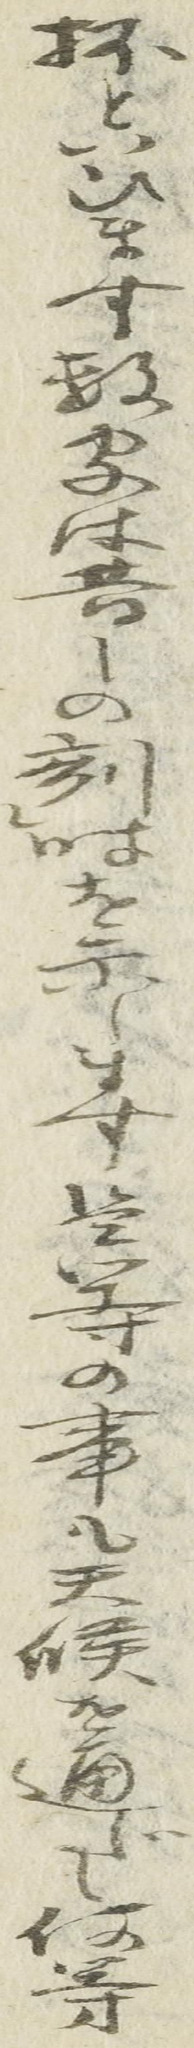抔といひます数字は昔しの刻時を示します是等の事も天候を通じて何等
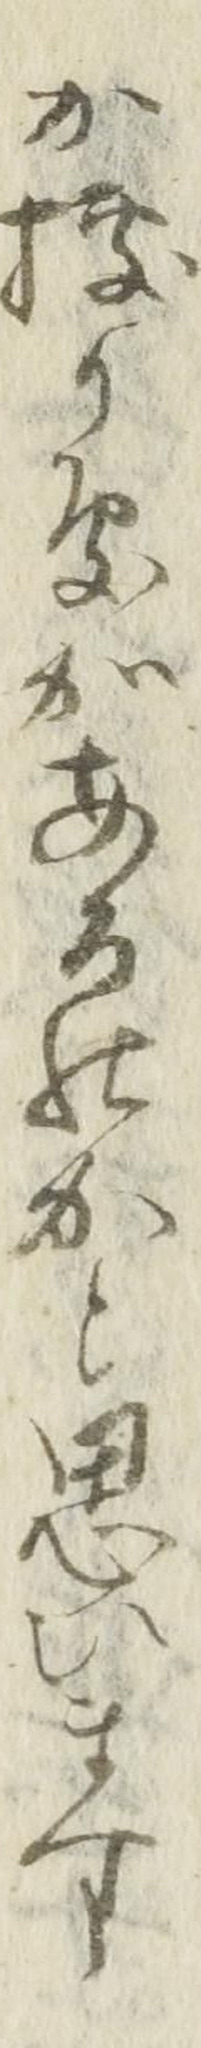か拠り處があるのかと思ひます
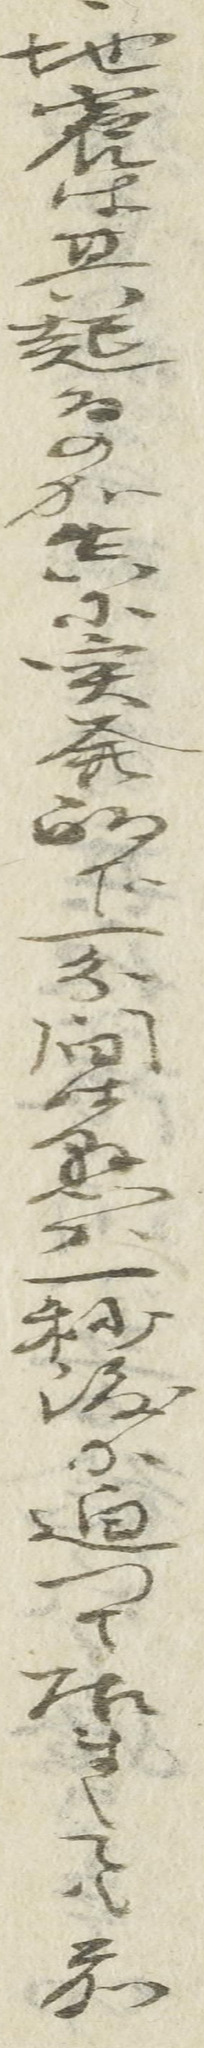一地震は其起るのが真に突発的で一分間は愚か一秒後に迫つて折ましても前
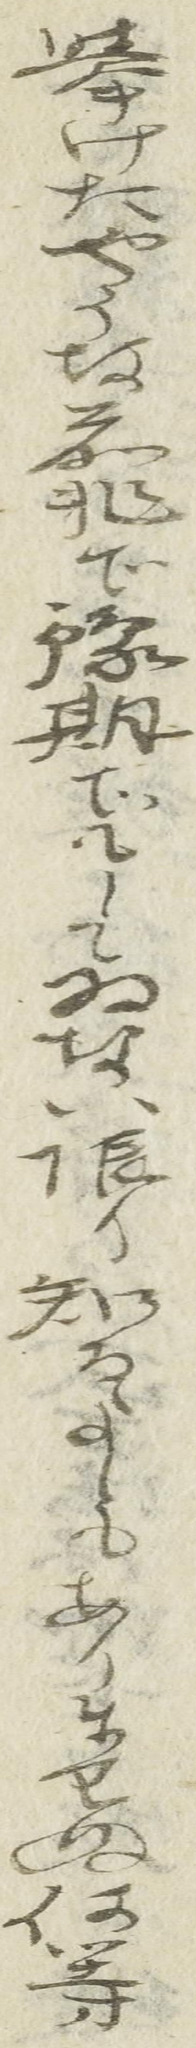挙けたやうな前兆で豫期でもしてゐない限り知るよしもありませぬ何等
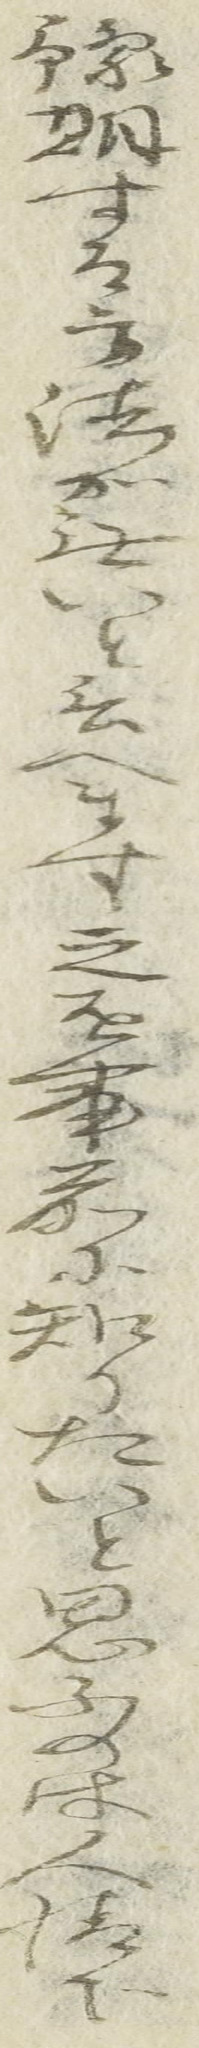豫期する方法が無いと云へます之を事前に知りたいと思ふのは人情で
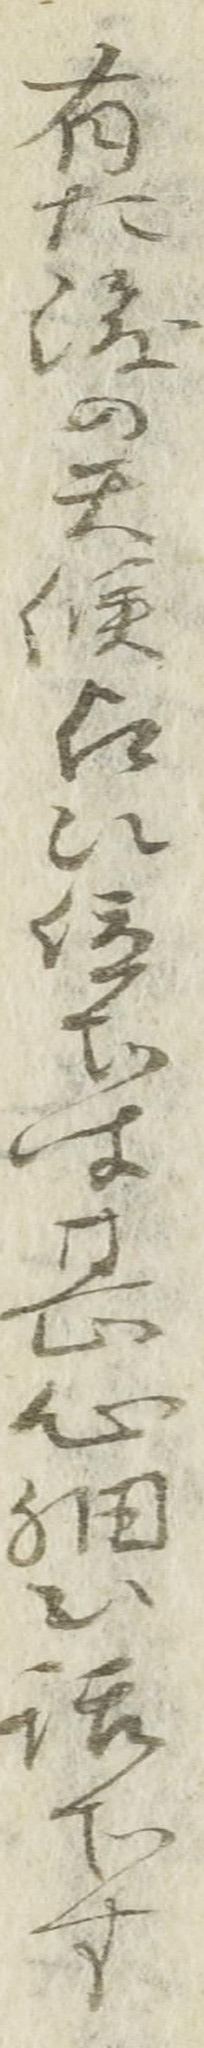有た後の天候占ひ位では甚心細い話です
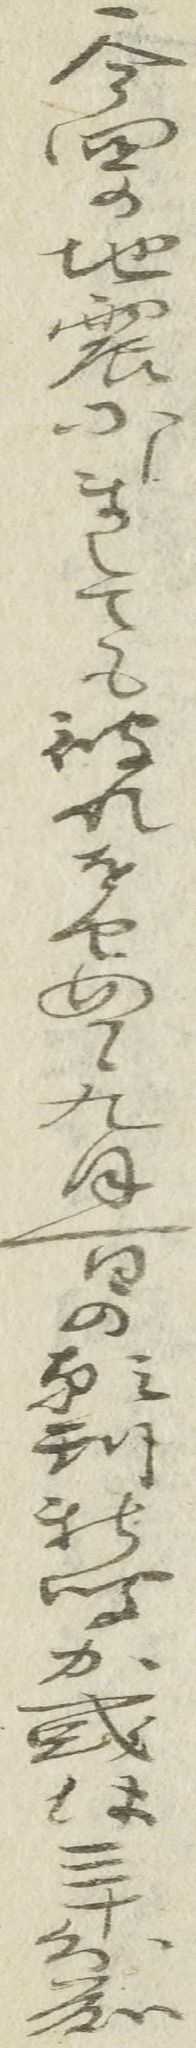一今回の地震にしましても被れをせめて九月一日の朝刊新聞か或は三十分前
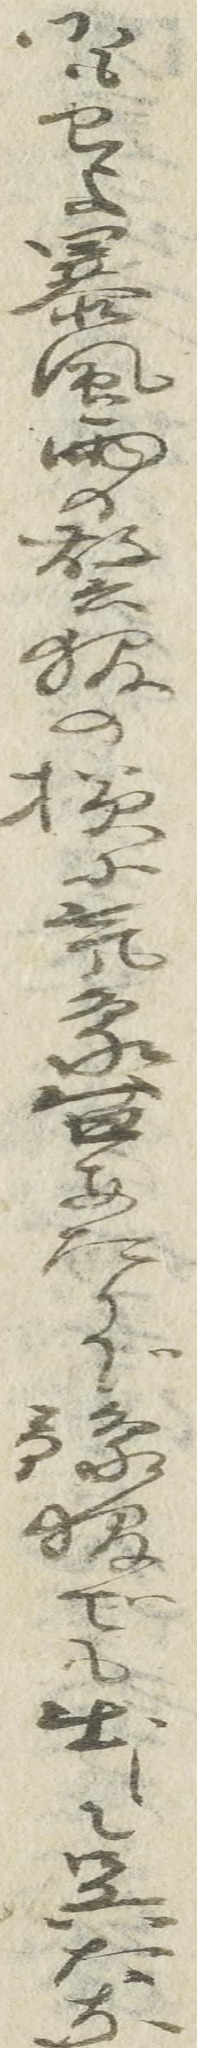にもせよ暴風雨の警報の様に気象台あたりで豫報でも出して呉たな
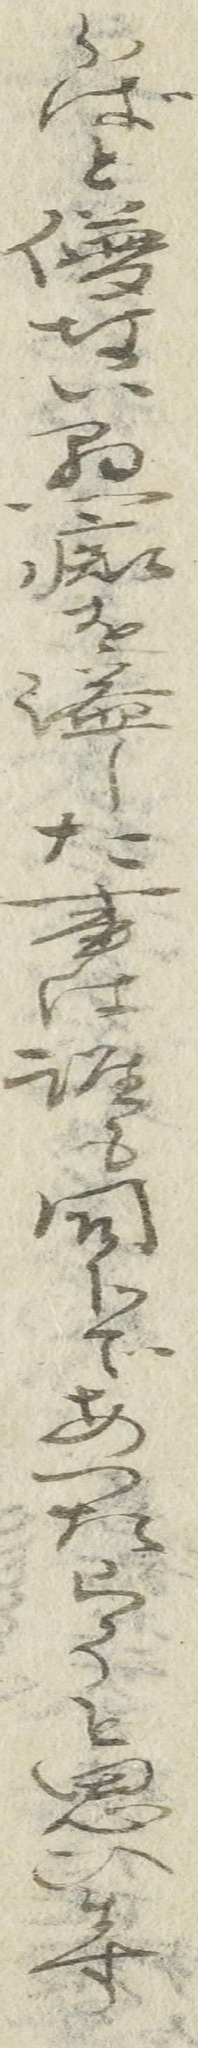らばと儚ない愚痴を溢した事は誰も同じであつたらうと思ひます
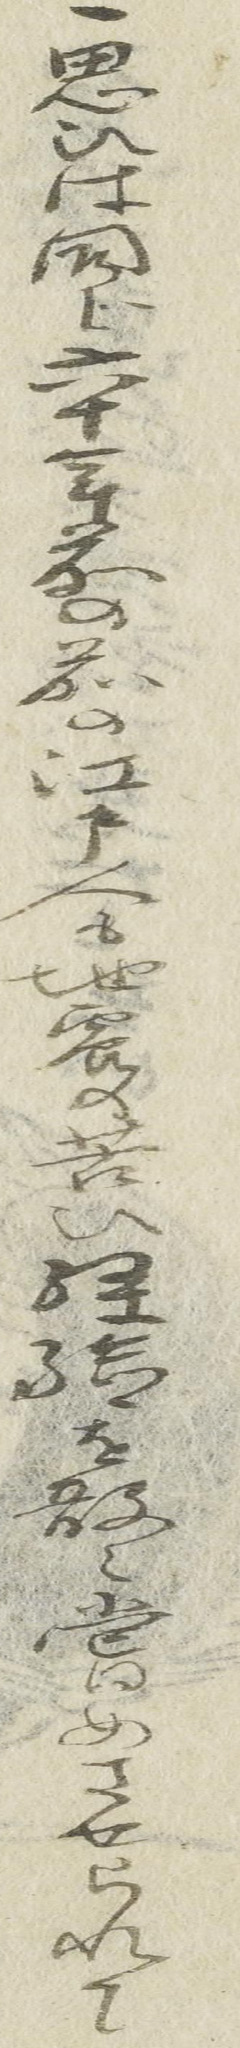一思ひは同じ六十年前の江戸人も地震の苦ひ経験を散々嘗めさせられて
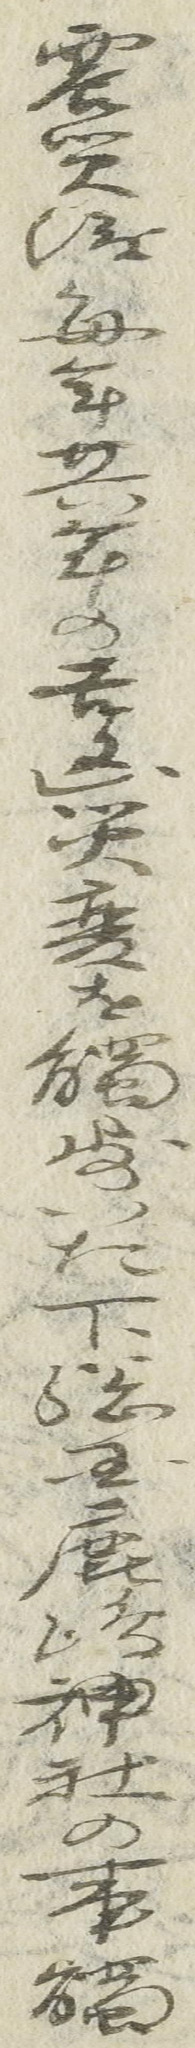震災後毎年其年の吉凶災変を觸歩いた下総国鹿嶋神社の事觸
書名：地震前兆集　全
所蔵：東京大学地震研究所図書室 Earthquake Research Institute Library, The University of Tokyo, JAPAN
